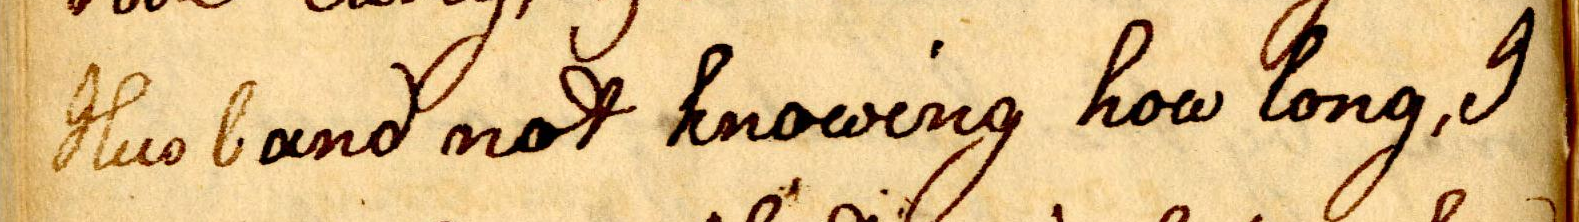Husband not knowing how long, I
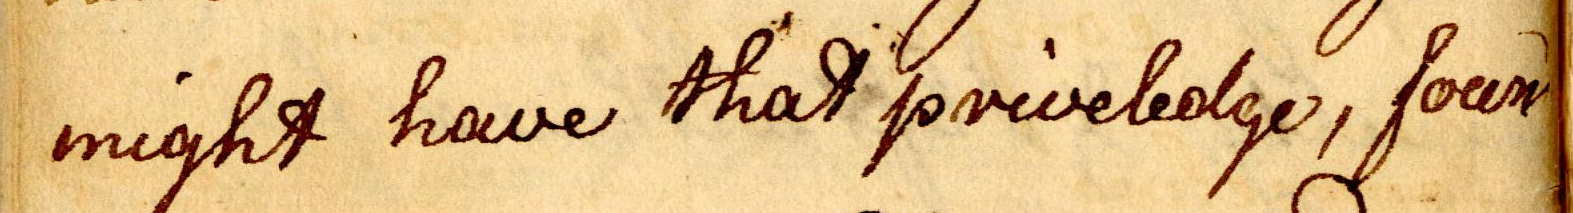might have that priveledge, found
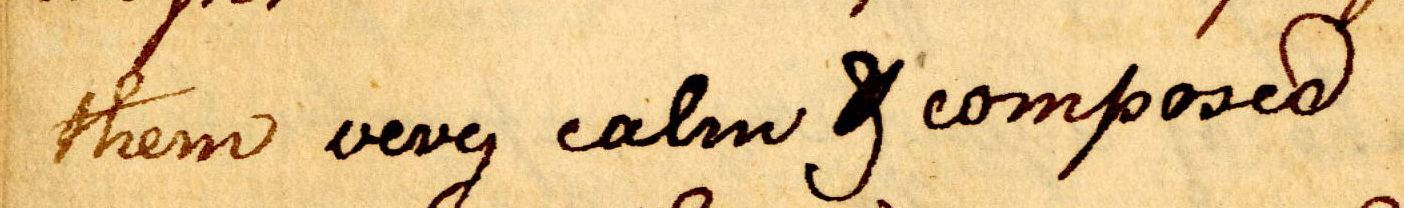them very calm & composed
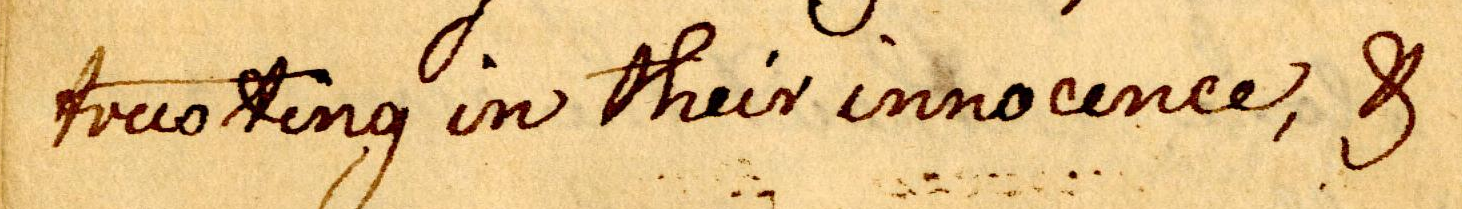trusting in their innocence, &
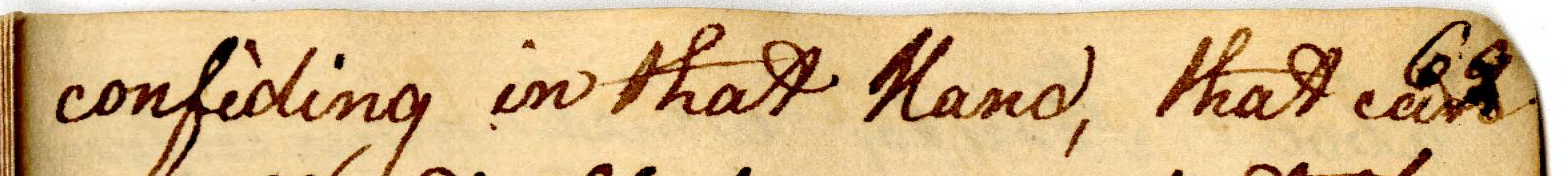confiding in that Hand, that can
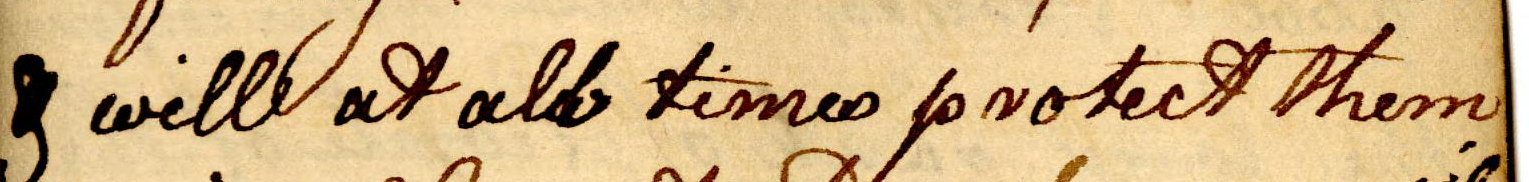& will at all times protect them
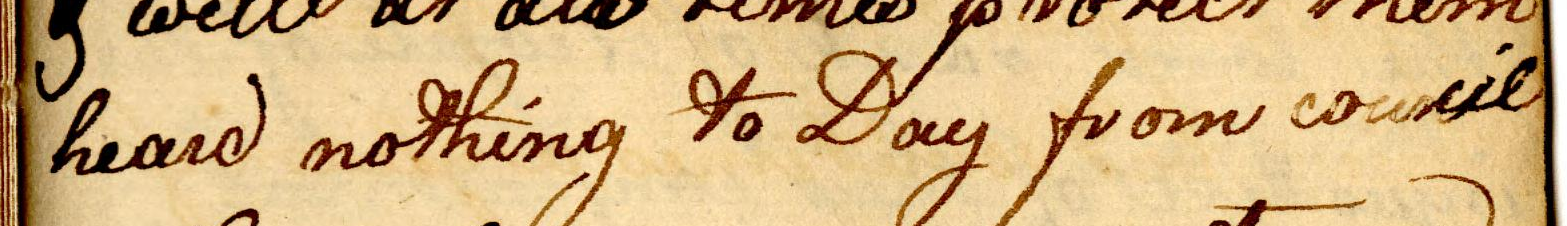heard nothing to Day from council
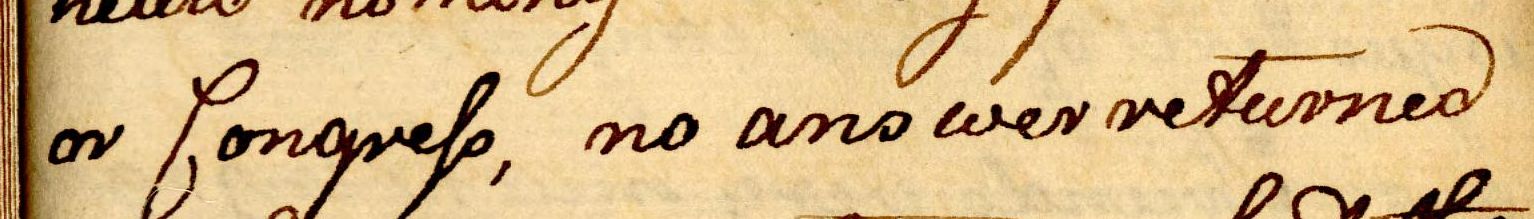or Congress, no answer returned
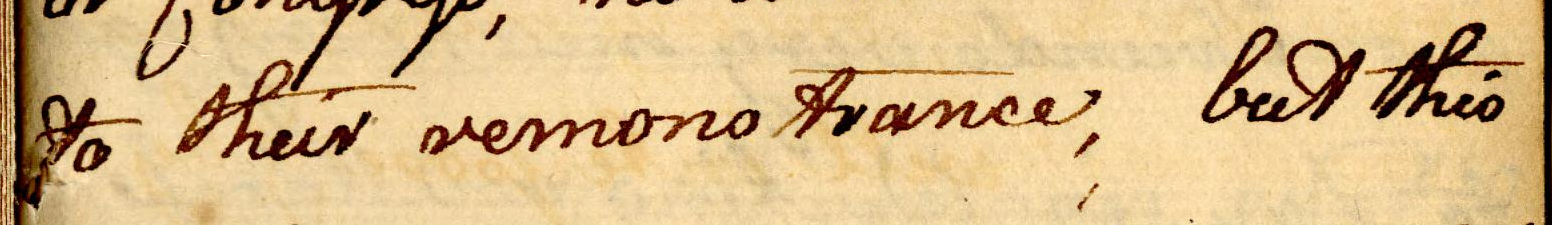to their remonstrance, but this
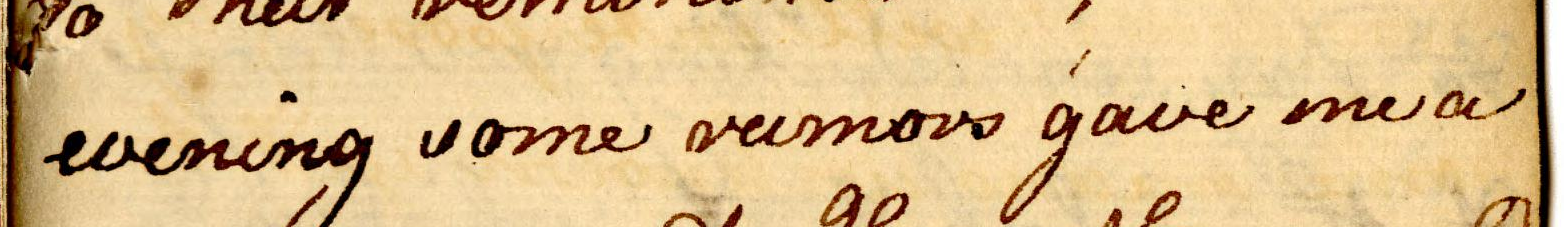evening some rumors gave me a
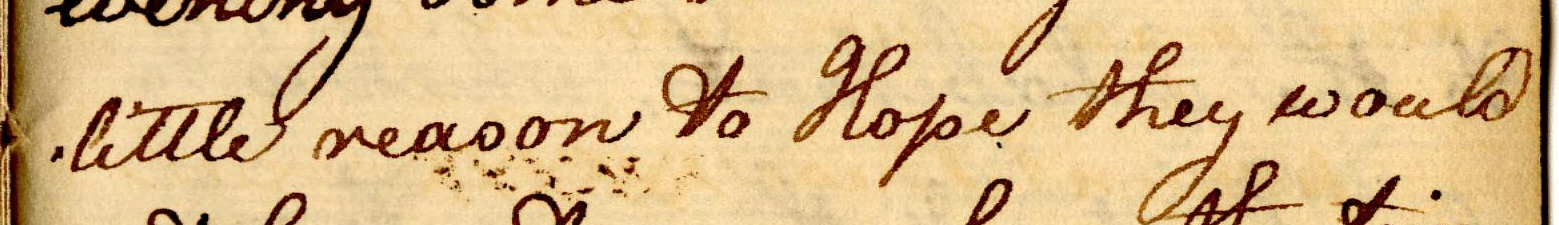little reason to Hope they would
